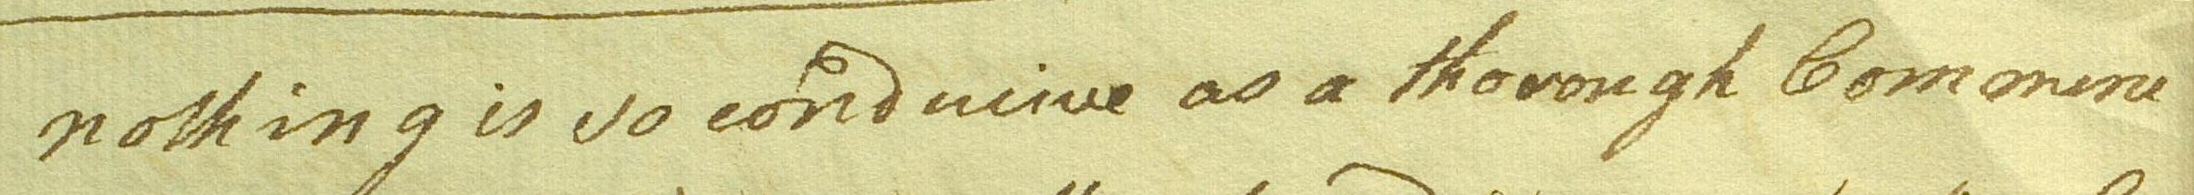nothing is so conducive as a thorough Commune
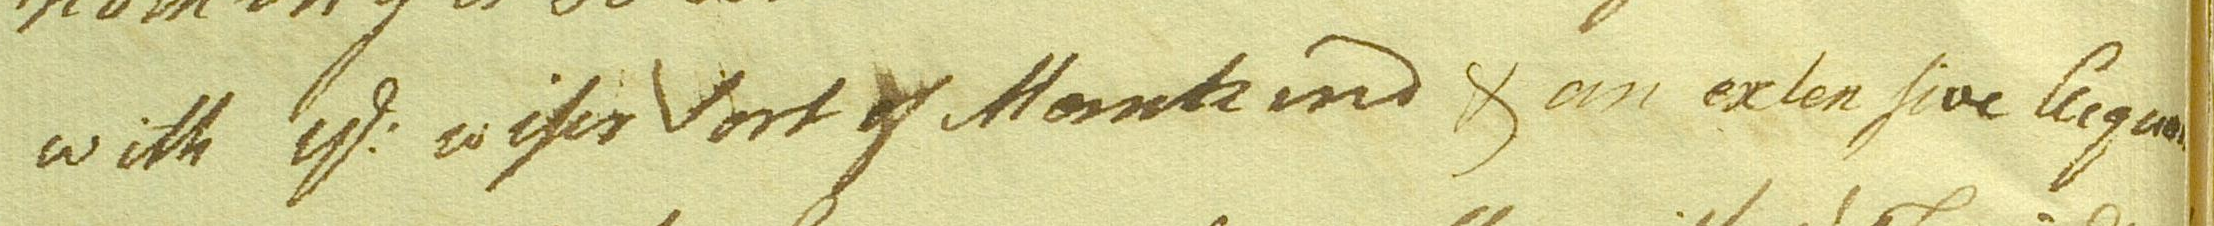with y^e: wiser Sort of Mankind & an extensive Acquain-
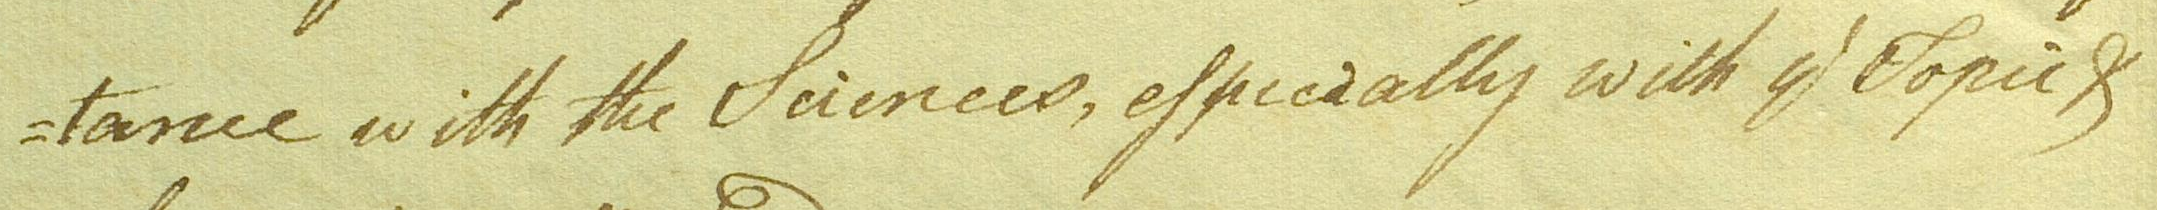-tance with the Sciences, especially with y^e Topic &
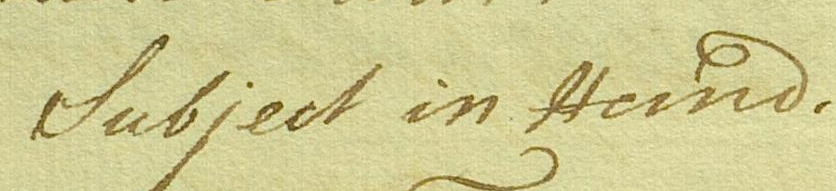Subject in Hand.
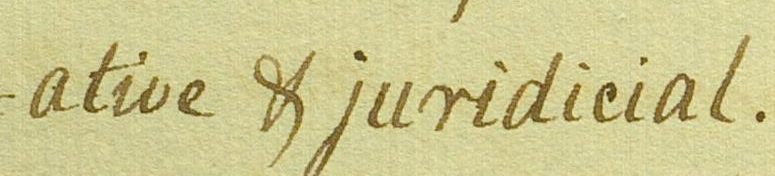-ative & juridical.
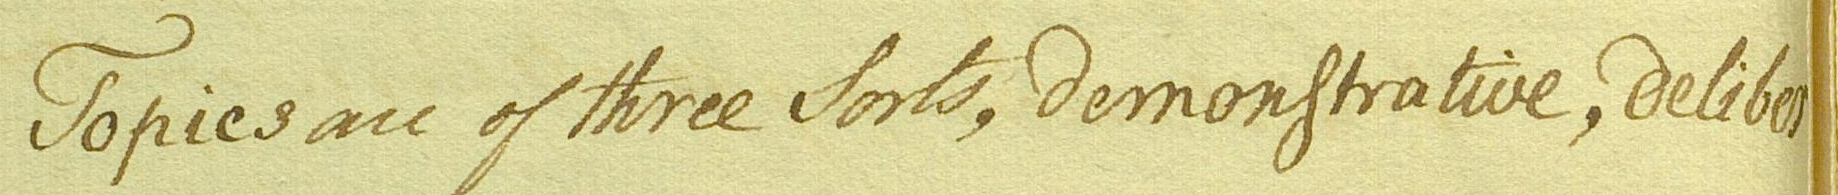Topics are of three Sorts, demonstrative, deliber-
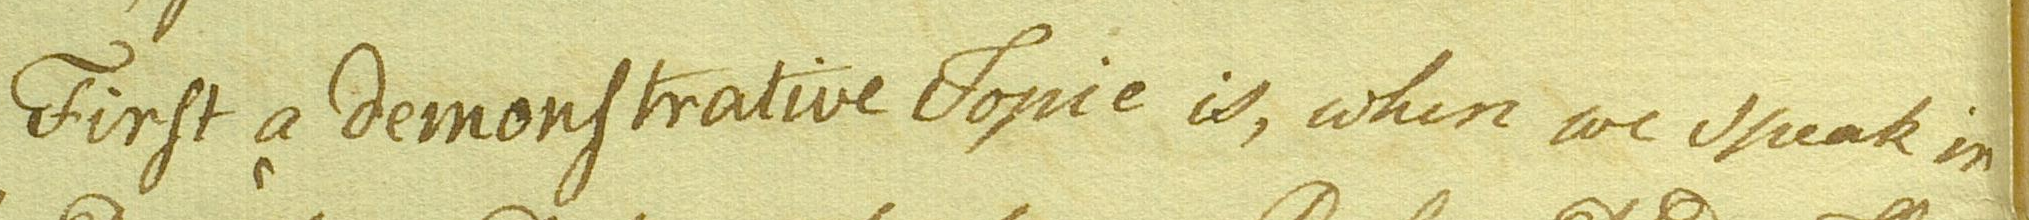First a demonstrative Topic is, when we speak in
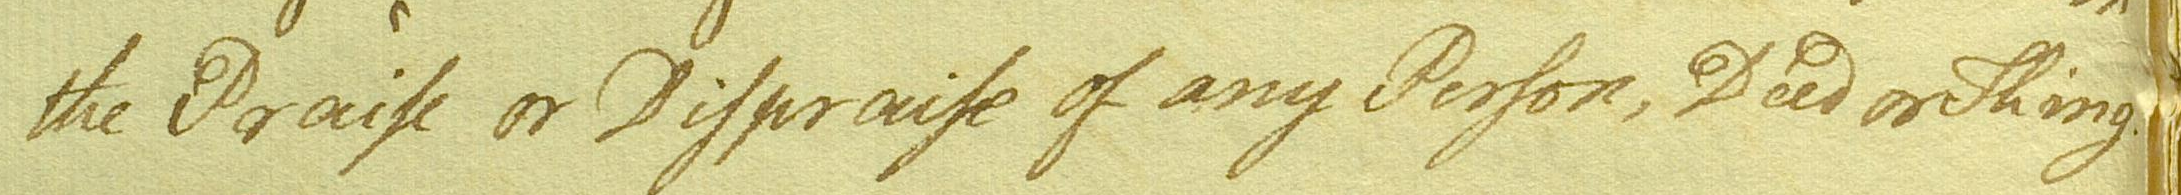the Praise or Dispraise of any Person, Deed or Thing.
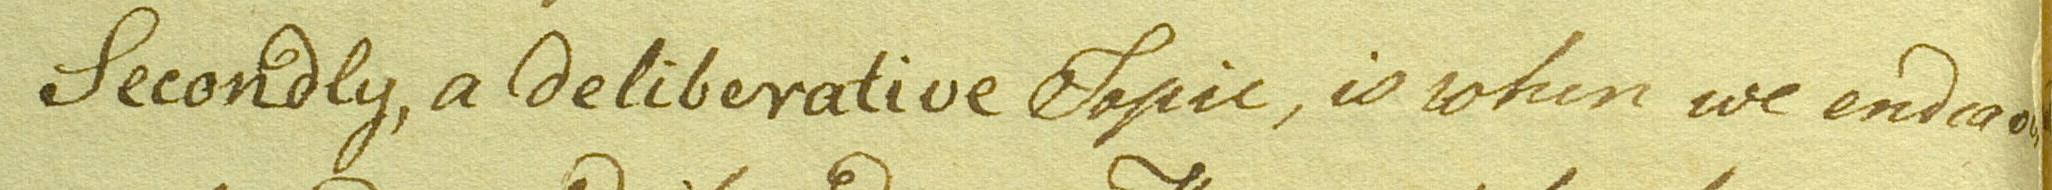Secondly, a deliberative Topic, is when we endeavor
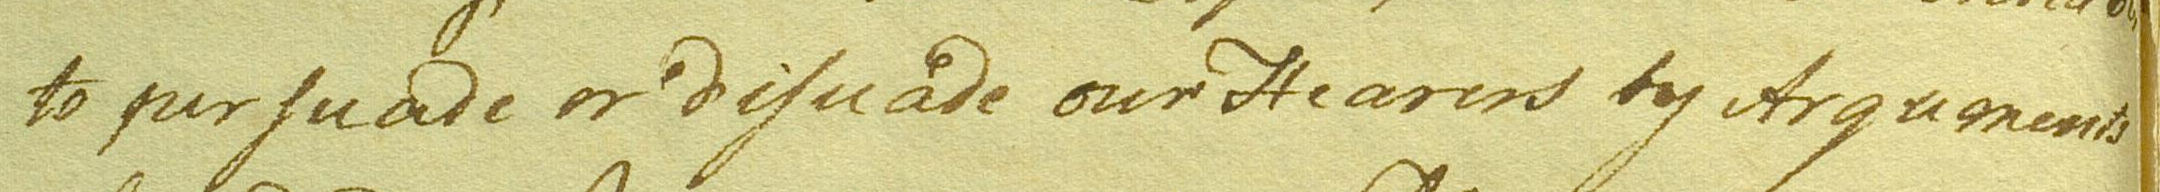to persuade or disuade our Hearers by Arguments
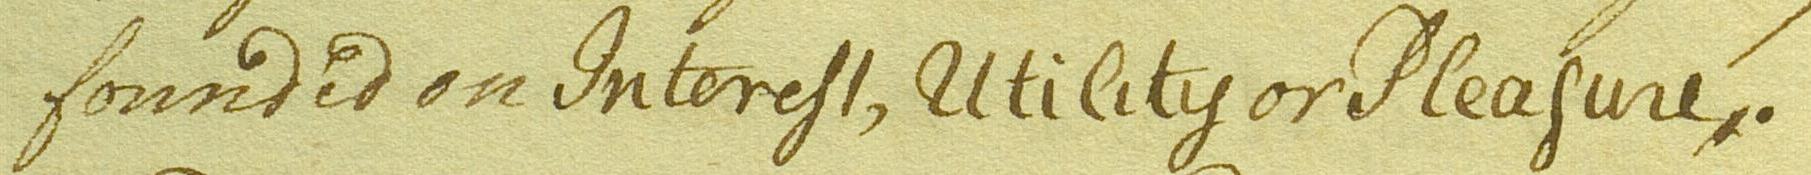founded on Interest, Utility or Pleasure.
